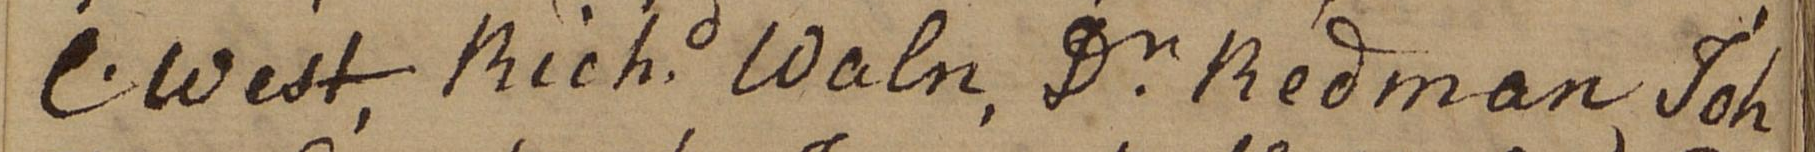C. West, Rich^d. Waln, D^r. Redman Joh
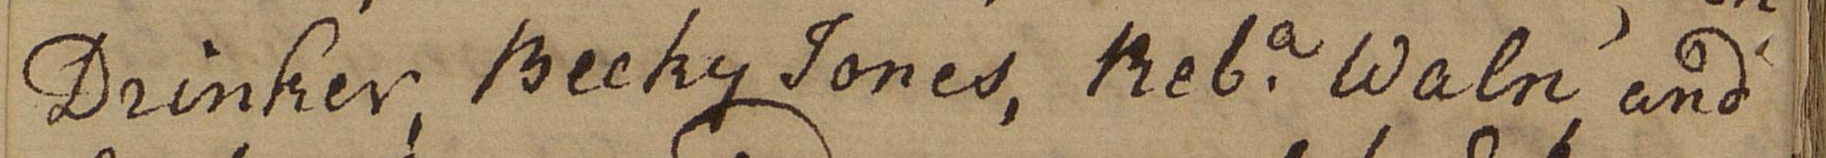Drinker, Becky Jones, Reb^a. Waln, and
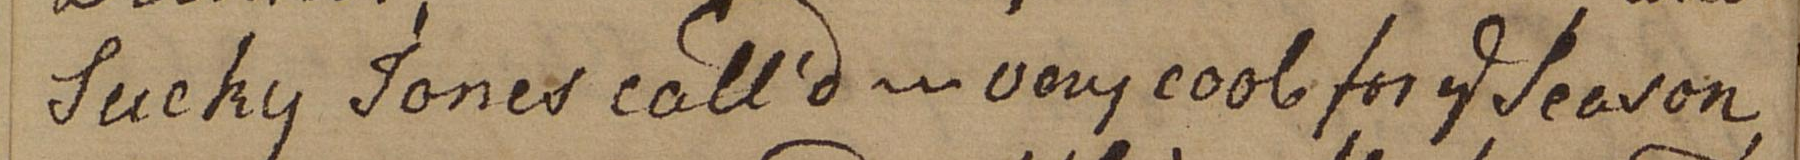Sucky Jones call'd- very cool for y^e Season
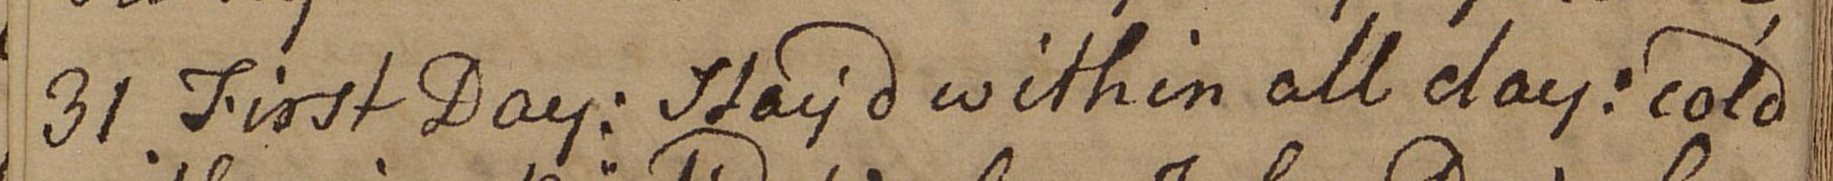31 First Day: Stay'd within all day: cold
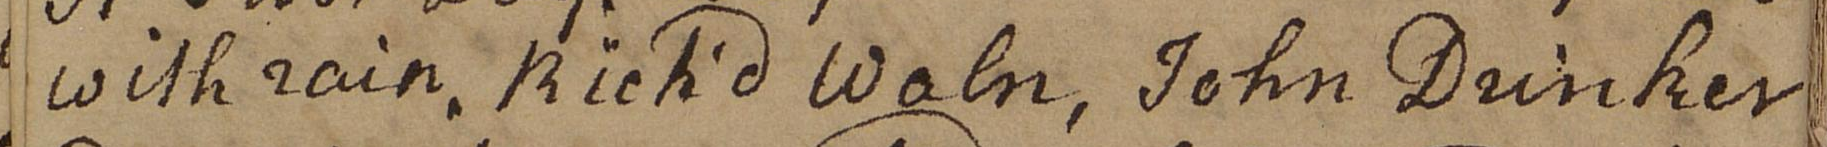with rain, Rich'd Waln, John Drinker
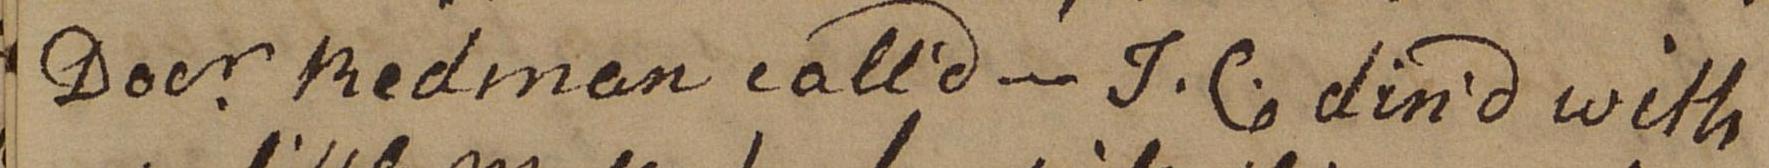Doc^r. Redman call'd- J.C. din'd with
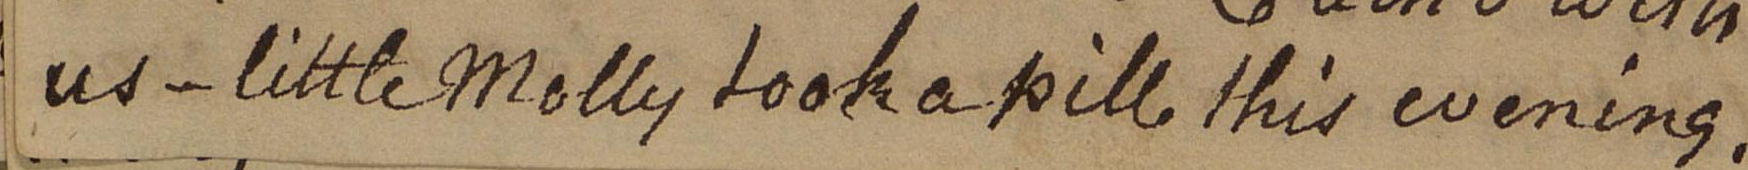us- little Molly took a pill this evening,
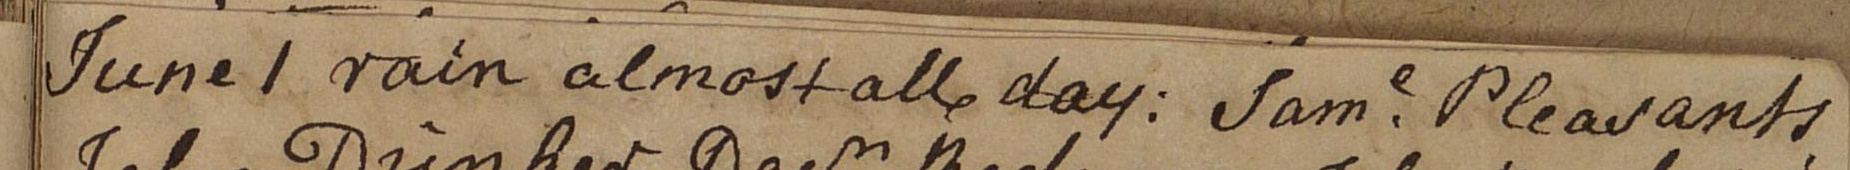June 1 rain almost all day: Sam^l. Pleasants
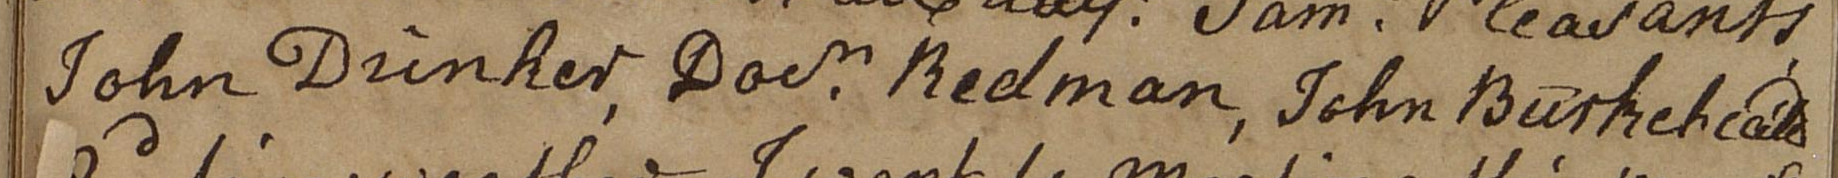John Drinker, Doc^r. Redman, John Burket call'd
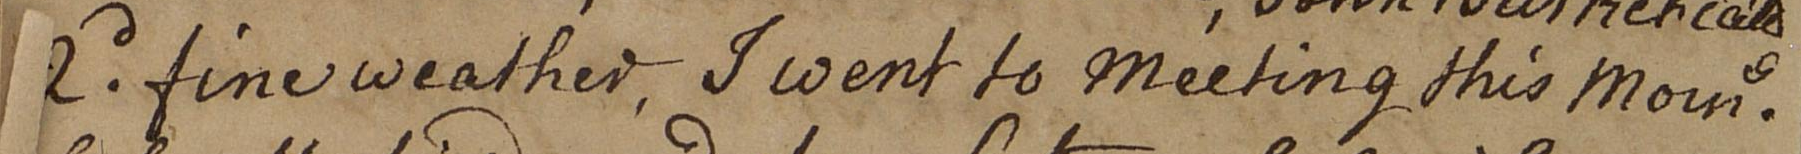2.^d fine weather, I went to meeting this morn^g.
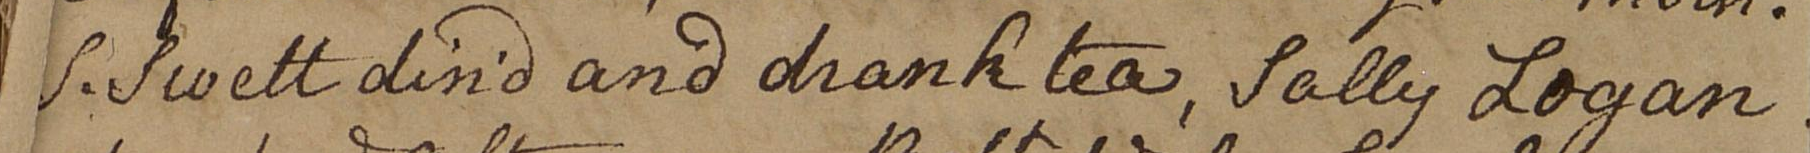S. Swett din'd and drank tea, Sally Logan
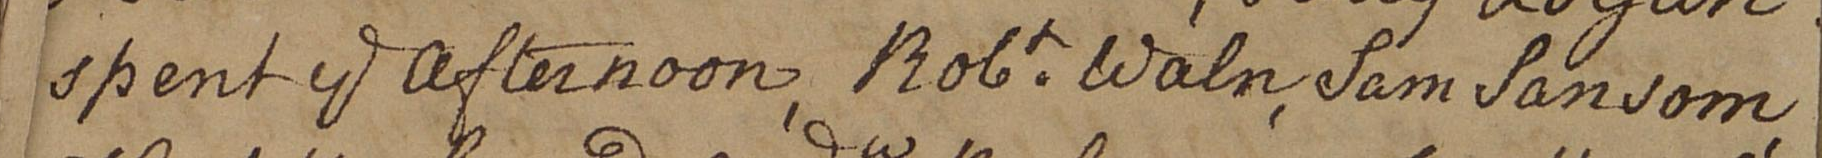spent y^e Afternoon, Rob^t. Waln, Sam Sansom,
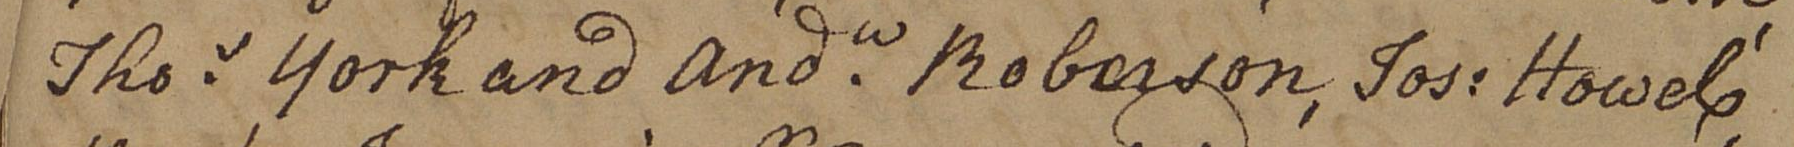Tho^s. York and And^w. Roberson, Jos: Howel,
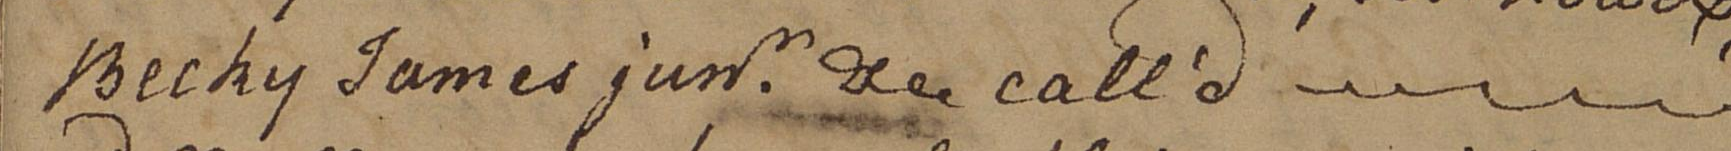Becky James jun^r. &c call'd-
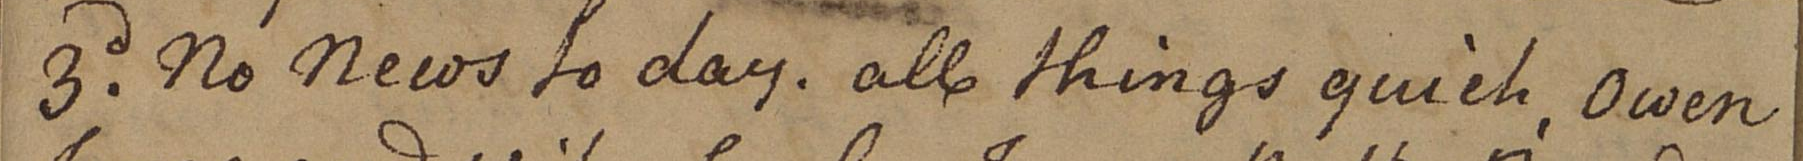3^d. No News to day. all things quick, Owen
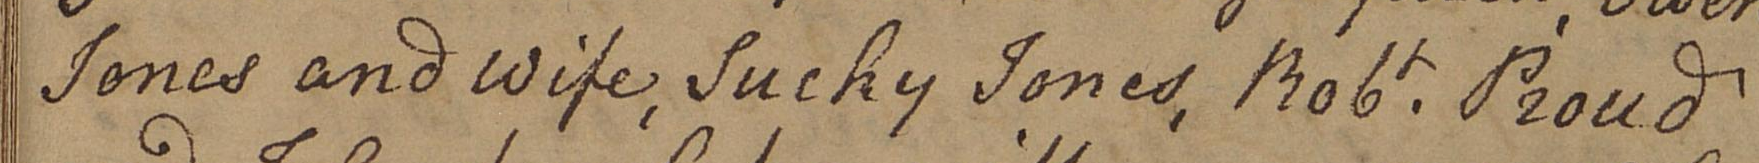Jones and Wife, Sucky Jones, Rob^t. Proud
